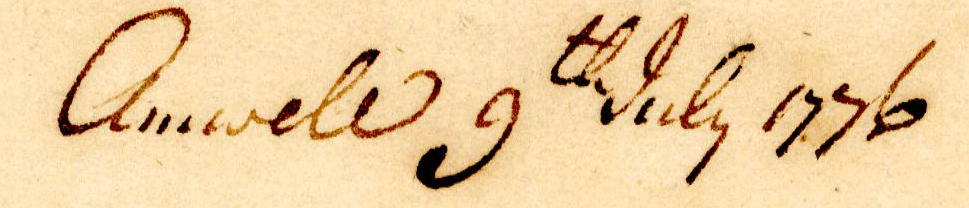Amwell 9^th July 1776
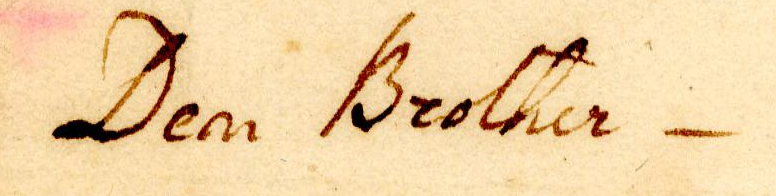Dear Brother-
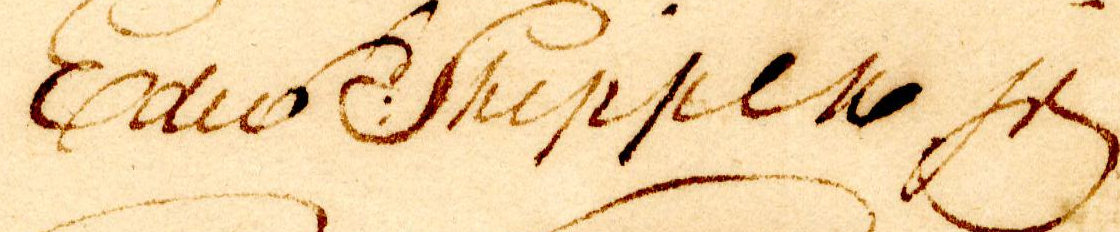Edw: Shippen jr
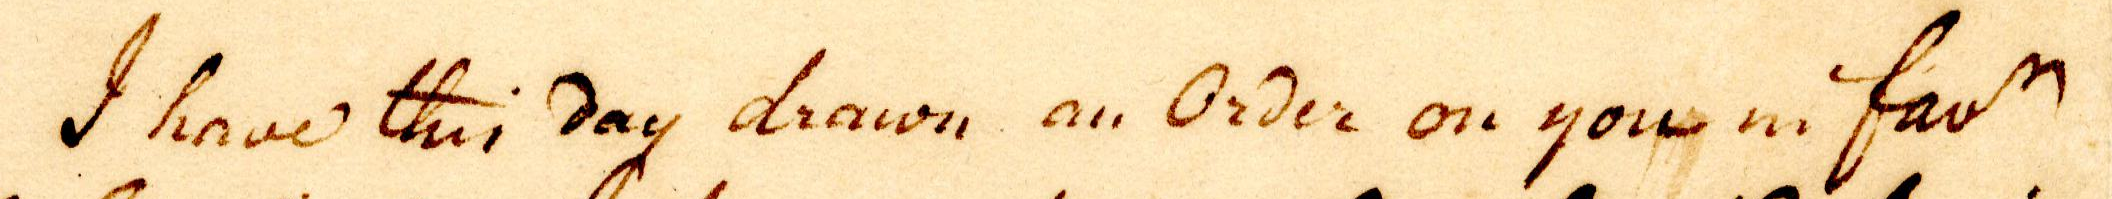I have this day drawn an Order on you in fav^r
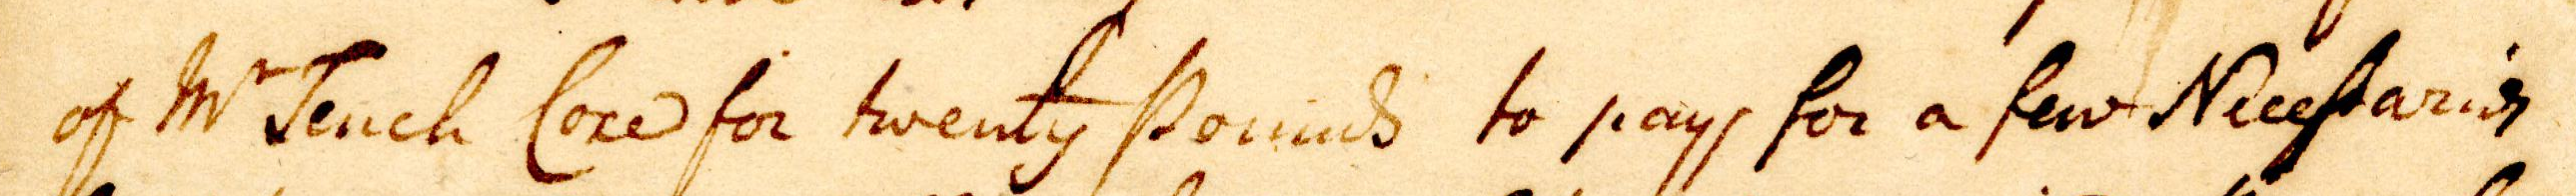of M^r Tench Coxe for twenty Pounds to pay for a few Necessaries
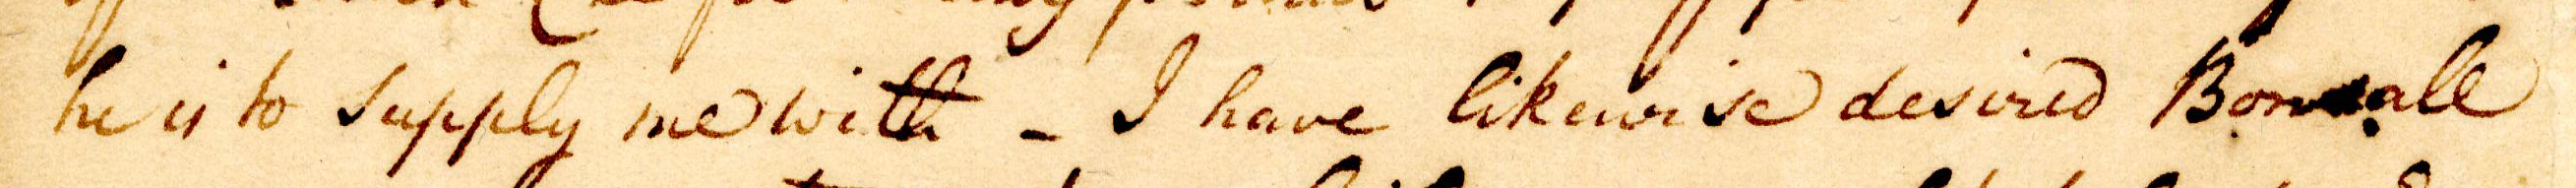he is to supply me with. I have likewise desired Bonsall
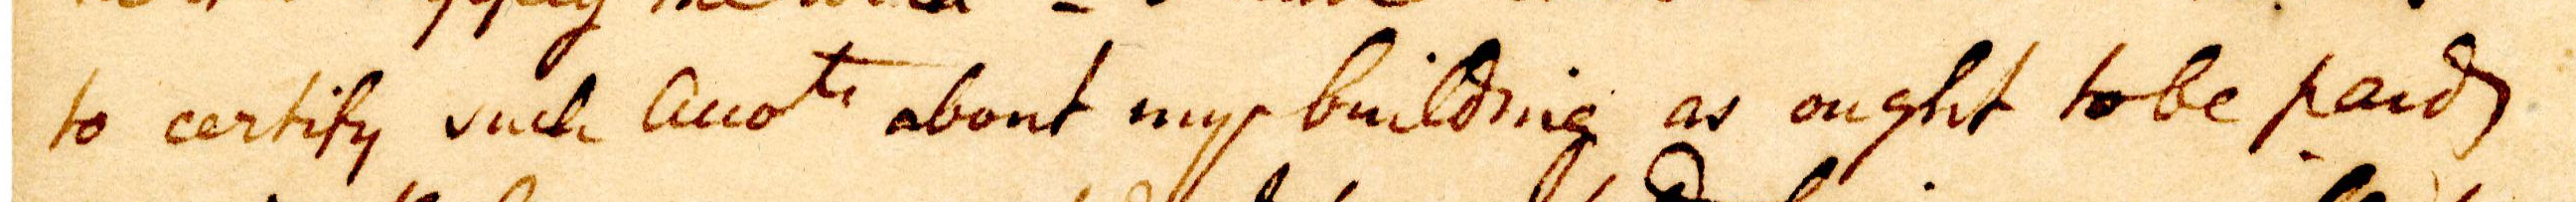to certify such Acco^t about my building as ought to be paid
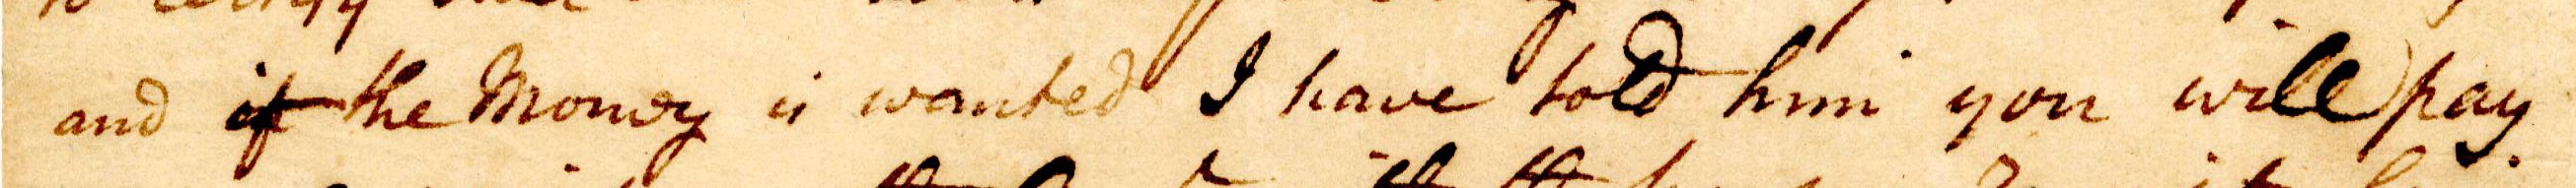and if the Money is wanted I have told him you will pay
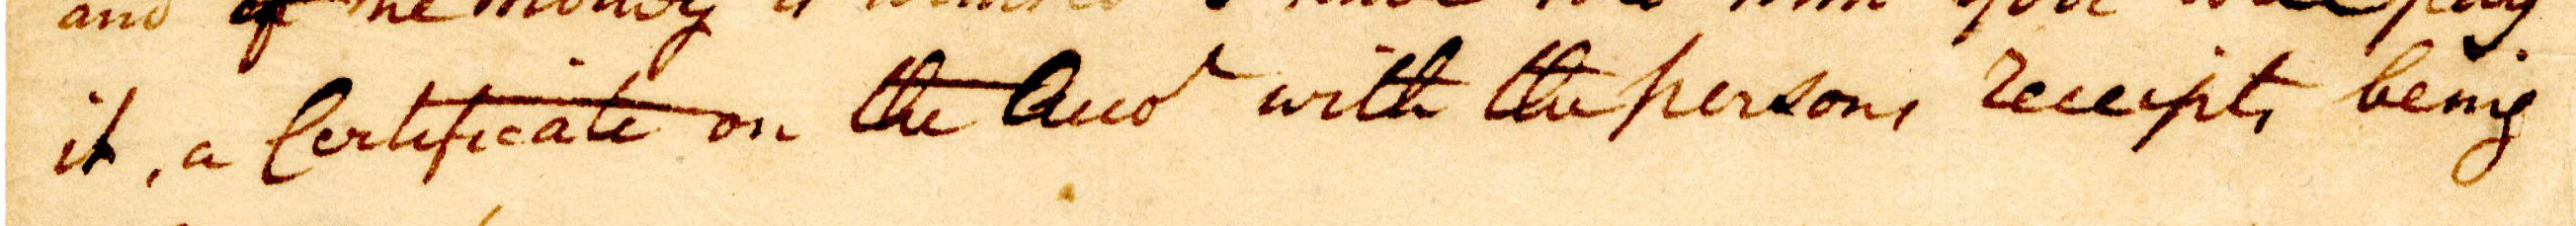it, a Certificate on the Acco^t with the persons receipt being
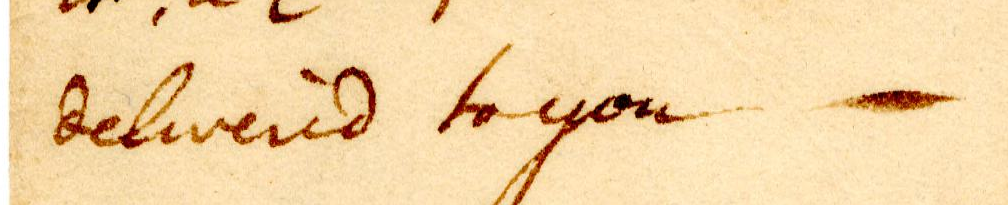delivered to you-
